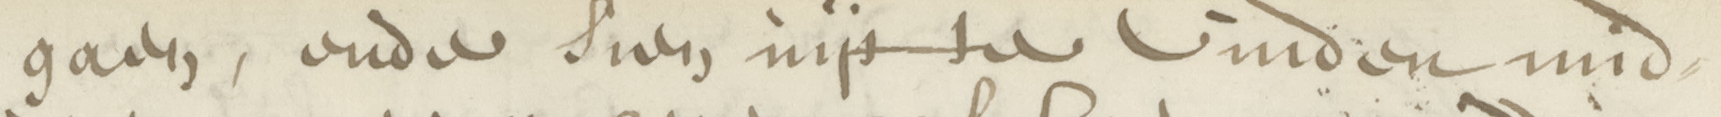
gaen, ende sien uijt te vinden mid„
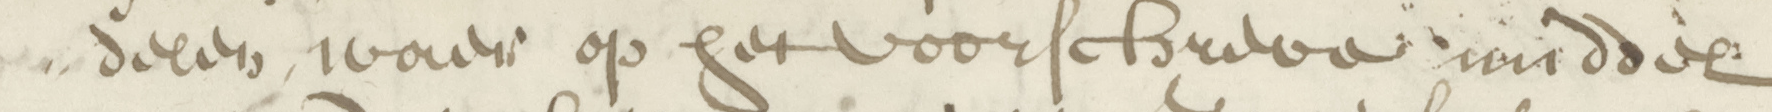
delen, waer op het voorschreve middel
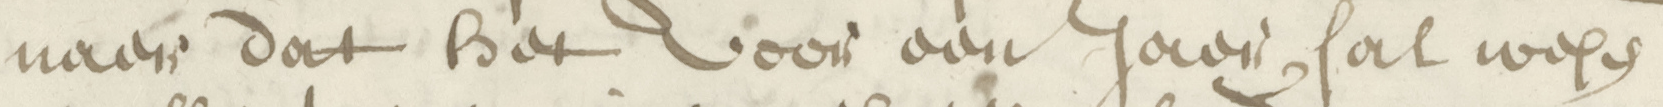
naer dat het voor een Jaer sal wesen
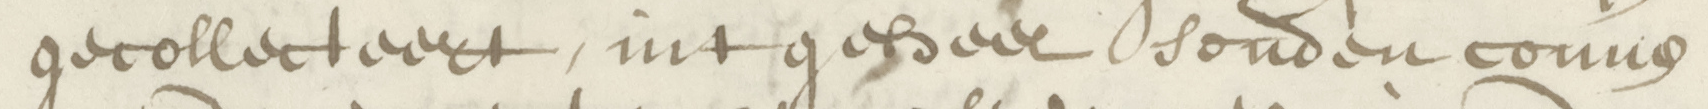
gecollecteert, int geheel souden connen
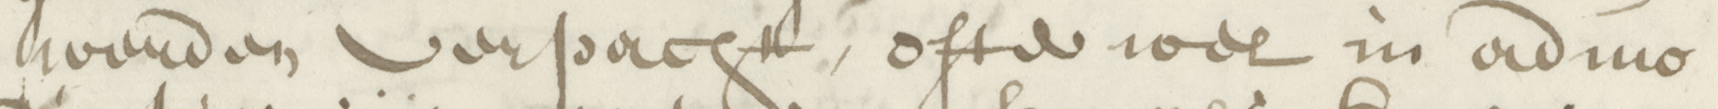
worden verpacht, ofte wel in admo
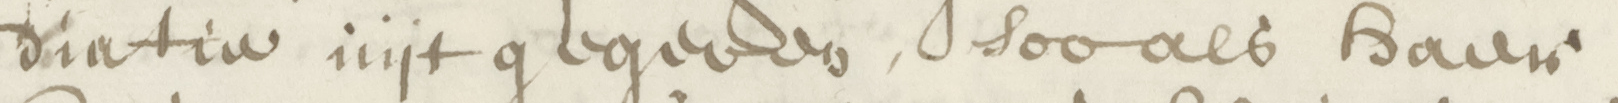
diatie uijt gegeven, soo als haer
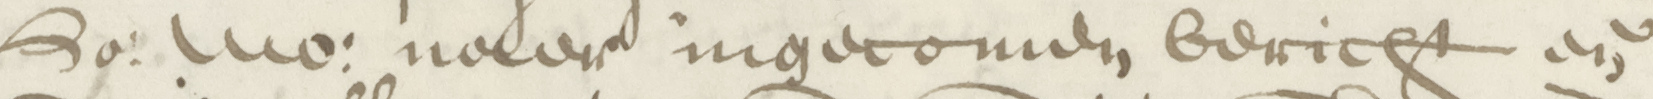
Ho:Mo: naer ingecomen bericht en
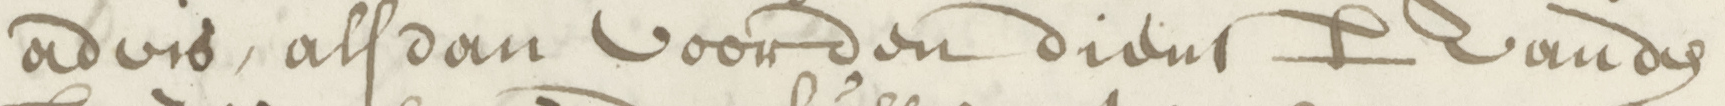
advis, alsdan voorden dienst van den
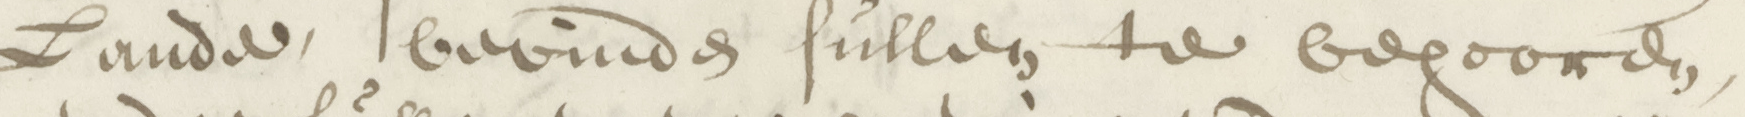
Lande, bevinden sullen te behooren,
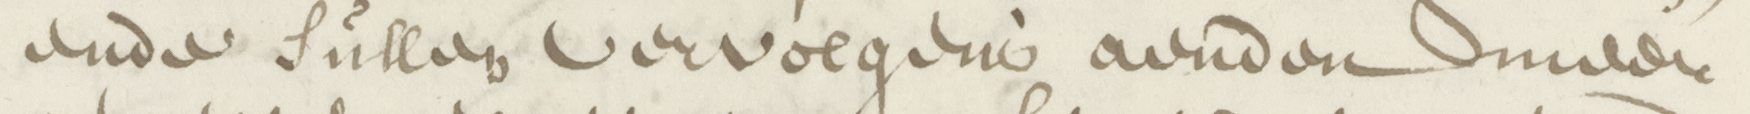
ende sullen vervolgens aenden meer
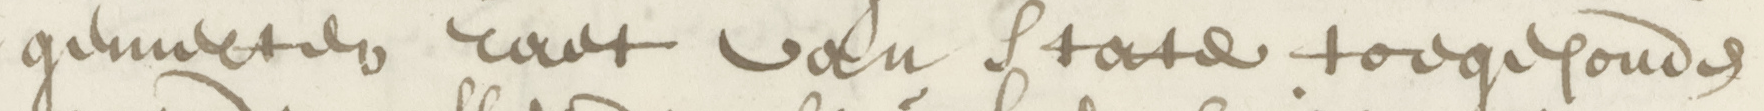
gemelten raet van State toegesonden
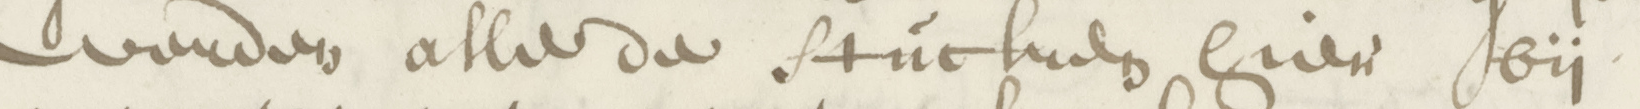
werden alle de stucken hier bij
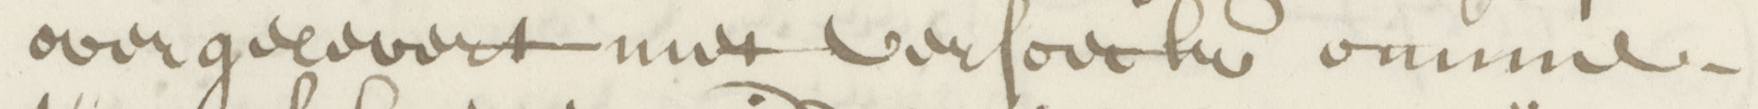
overgelevert met versoecke omme
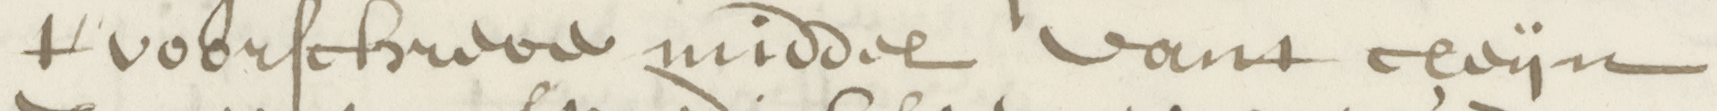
t'voorschreve middel vant cleijn
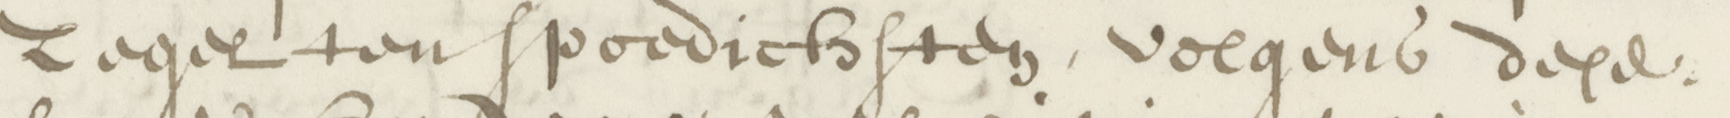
zegel ten spoedichsten, volgens dese
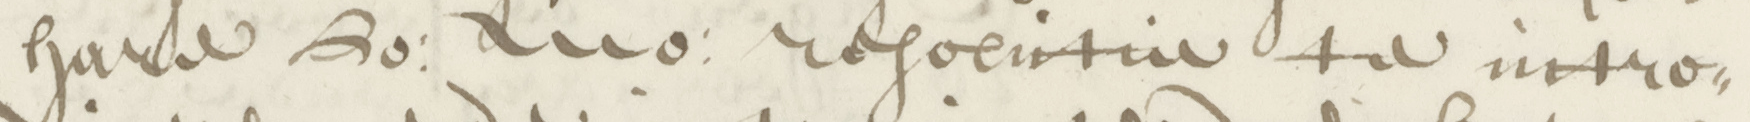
hare Ho:Mo: resolutie te intro„
